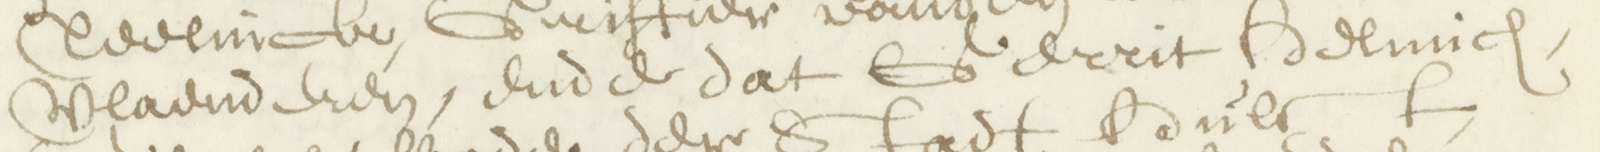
Vlaenderen, ende dat Gerrit Helmich,
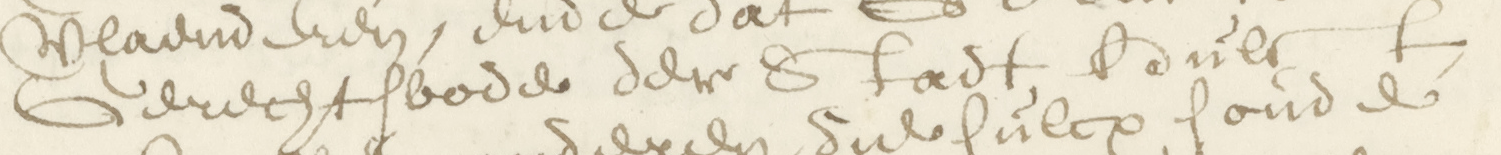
Gerechtsbode der Stadt Hulst,
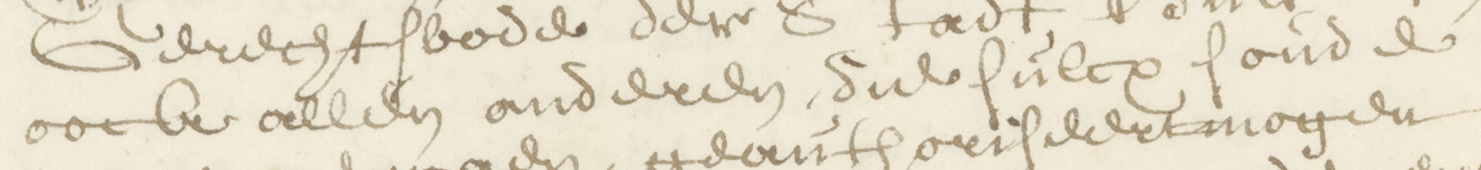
oock allen anderen, die sulcx soude
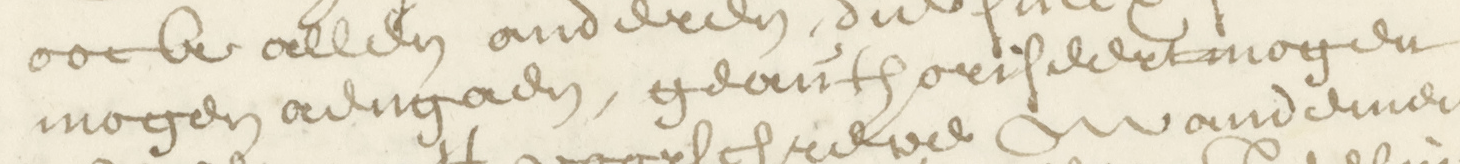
mogen aengaen, geauthoriseert mogen
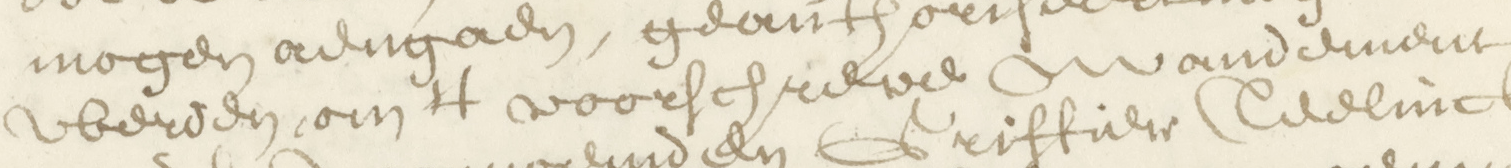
werden, om 't voorschreve Mandement
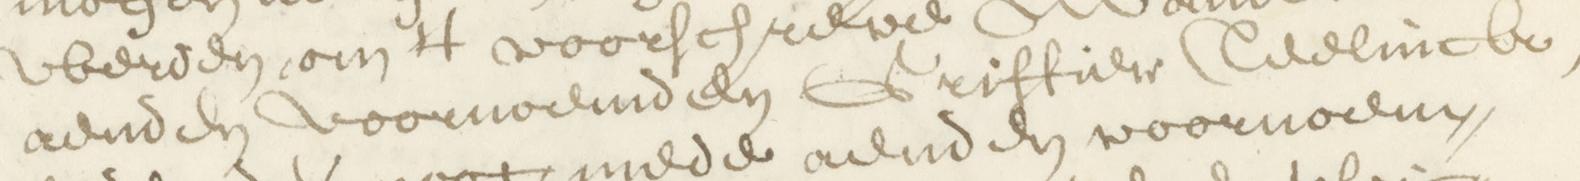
aenden voornoemden Griffier Teelinck,
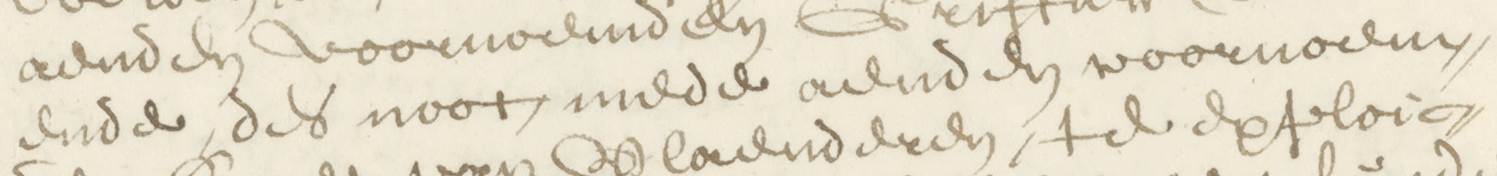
ende, des noot, mede aenden voornoem„
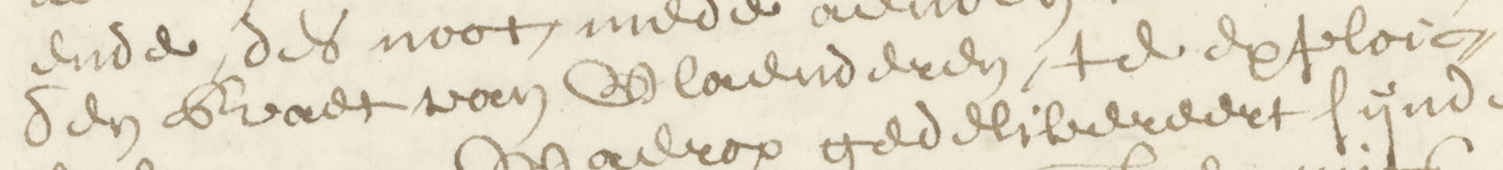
den Raet van Vlaenderen, te exploic,,
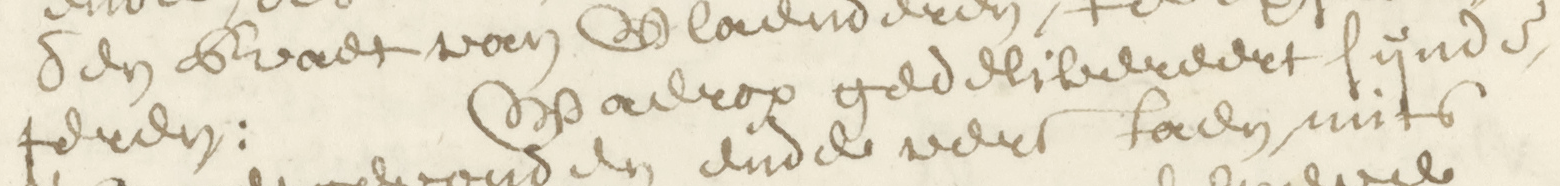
teren: Waerop gedelibereert sijnde,
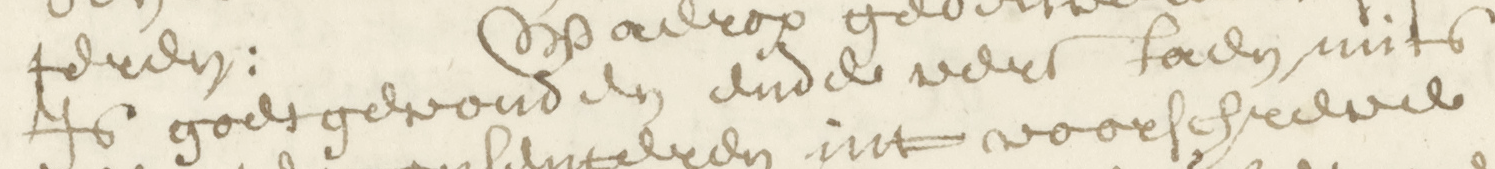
Is goetgevonden ende verstaen, mits
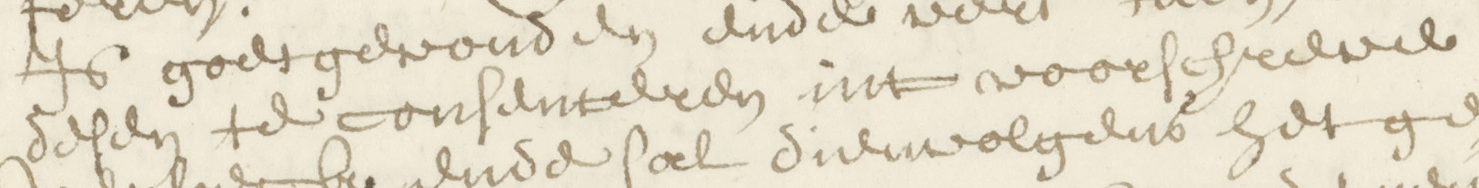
desen te consenteren int voorschreve
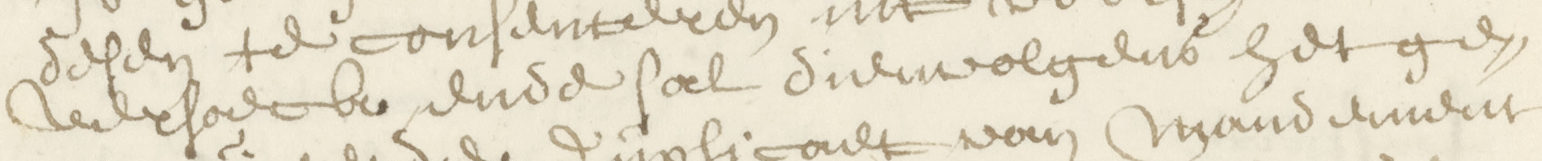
versoeck, ende sal dienvolgens het ge„
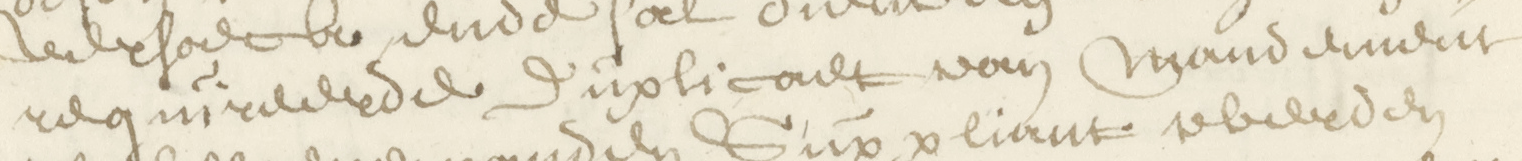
requireerde duplicaet van mandement
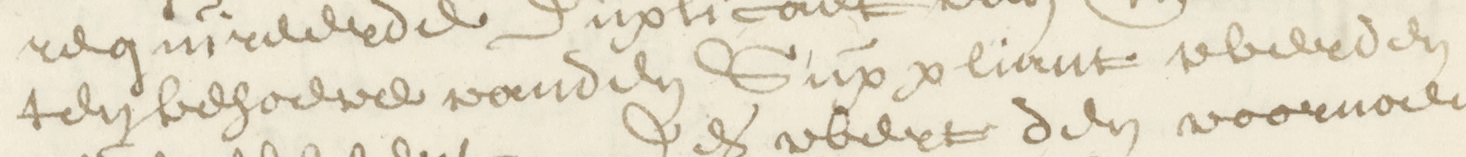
ten behoeve vanden Suppliant werden
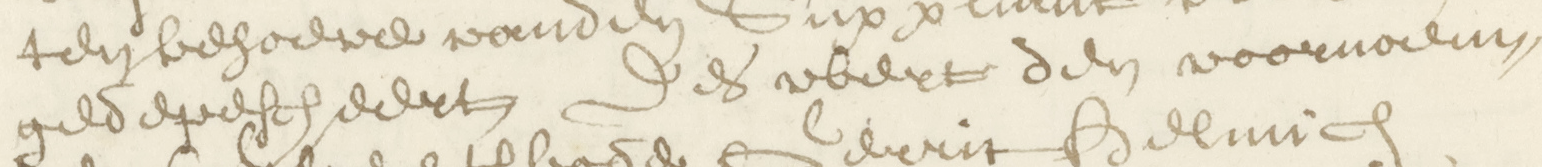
gedepescheert. Des wert den voornoem,,
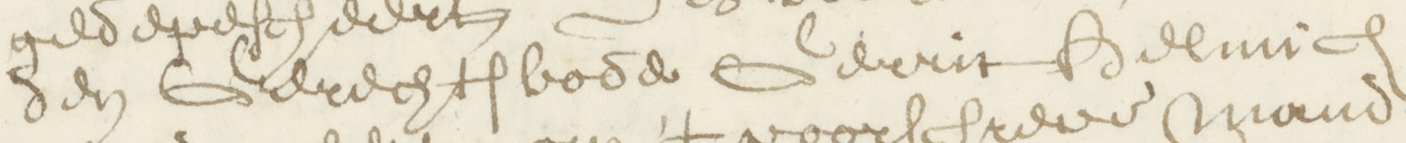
den Gerechtsbode Gerrit Helmich
